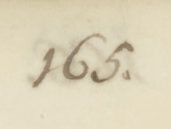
165.
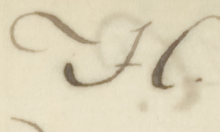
H.
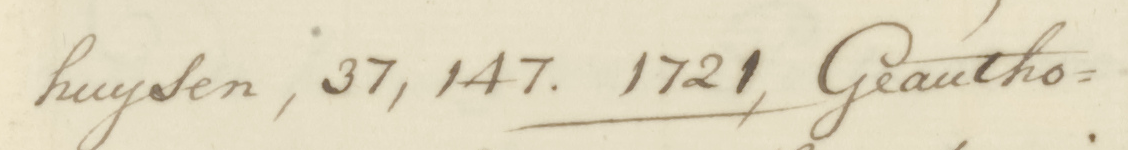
huysen, 37, 147. 1721, Geautho=
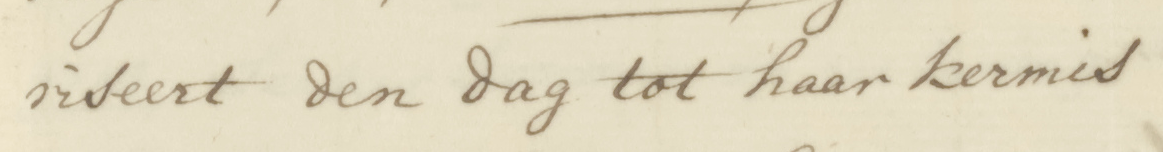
riseert den dag tot haar kermis
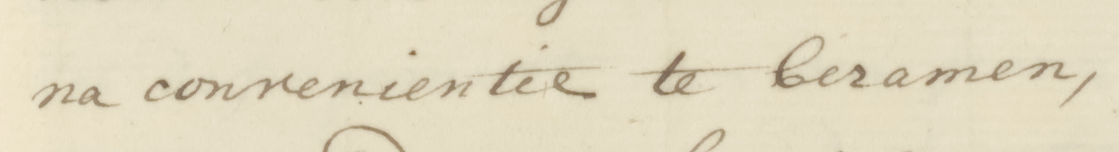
na convenientie te beramen,
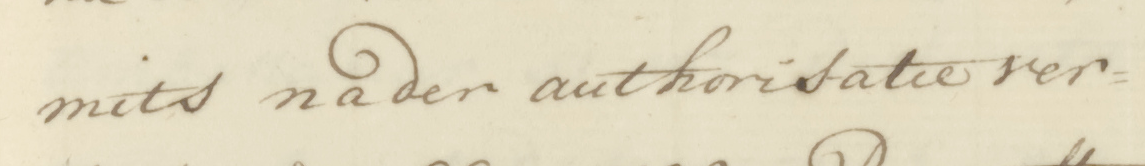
mits nader authorisatie ver=
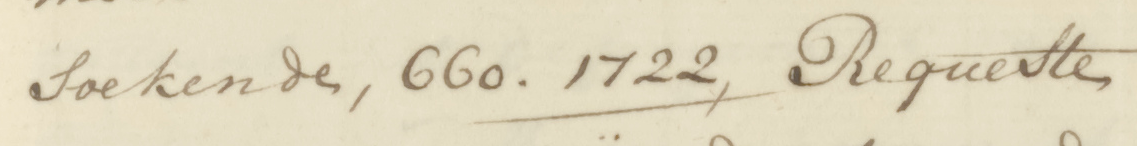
soekende, 660. 1722, Requeste
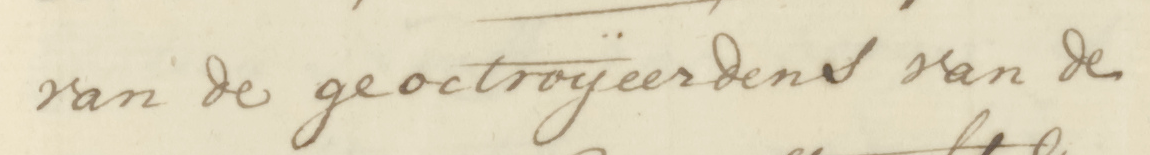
van de geoctroijeerdens van de
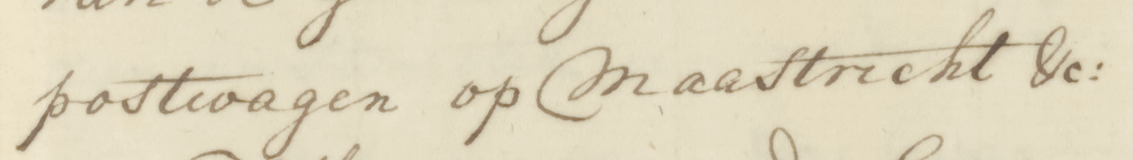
postwagen op Maastricht &c:
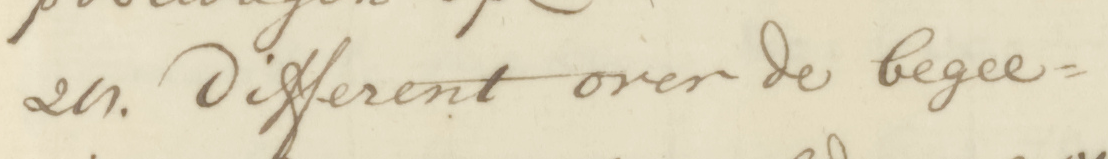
28. Different over de begee=
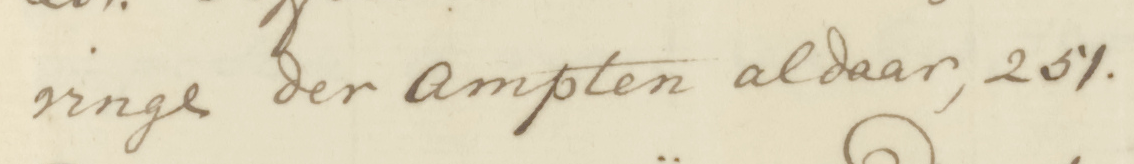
vinge der Ampten aldaar, 251.
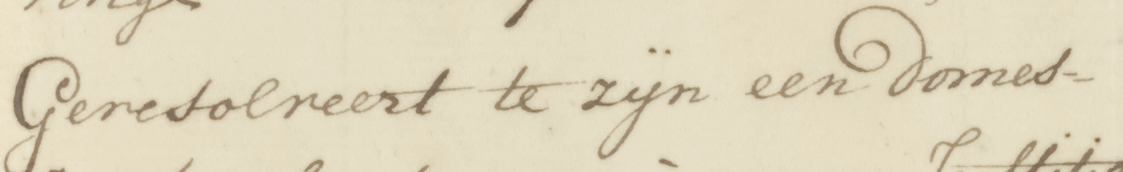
Geresolveert te zijn een domes=
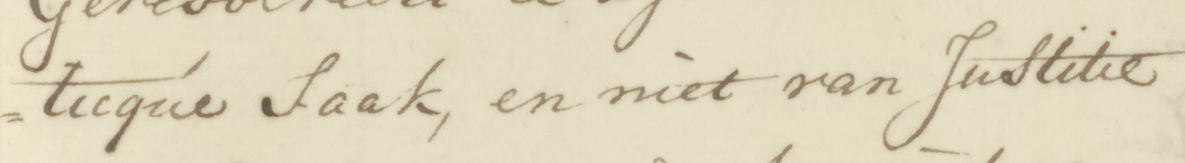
„ticque saak, en niet van Justitie
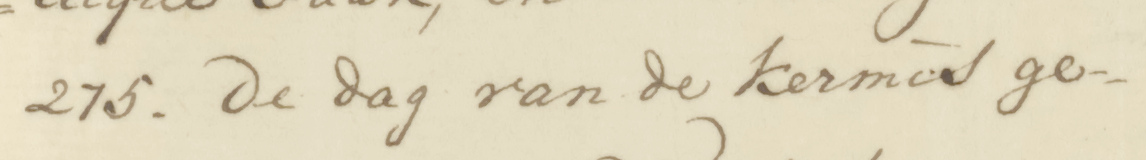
275. de dag van de kermis ge„
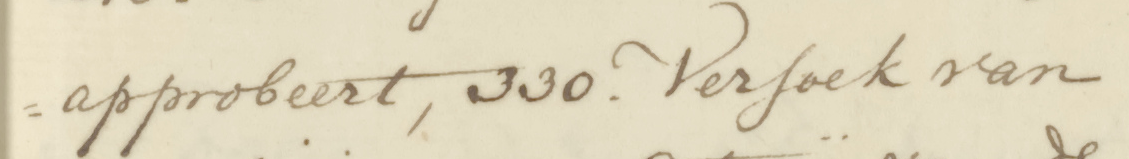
„approbeert, 330. Versoek van
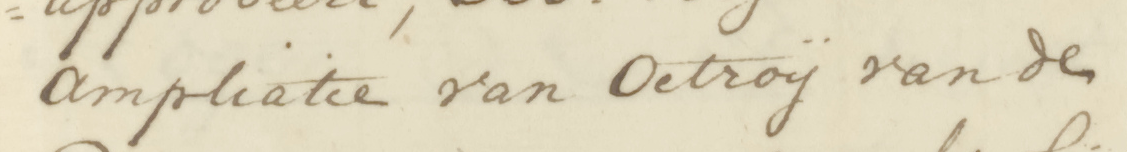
ampliatie van Octroij van de
